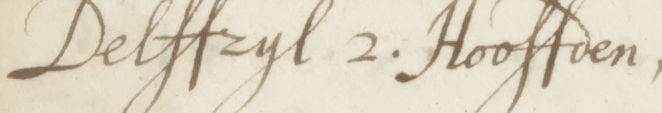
Delffzyl 2. Hooffden
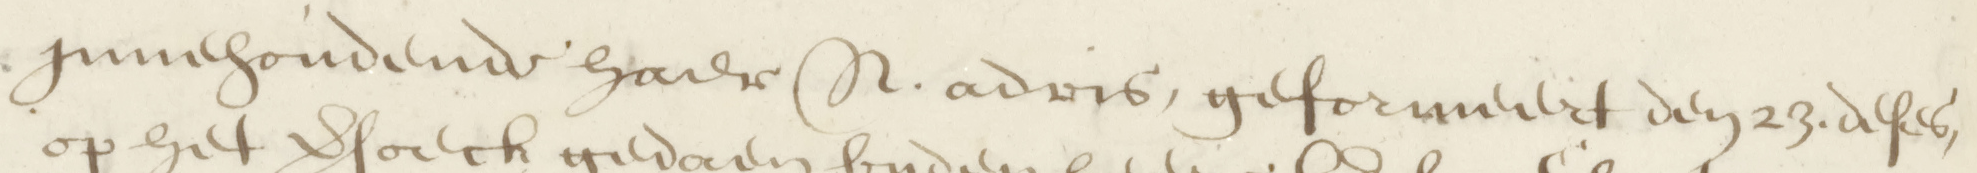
Innehoudende haer E. advis, geformeert den 23. deses,
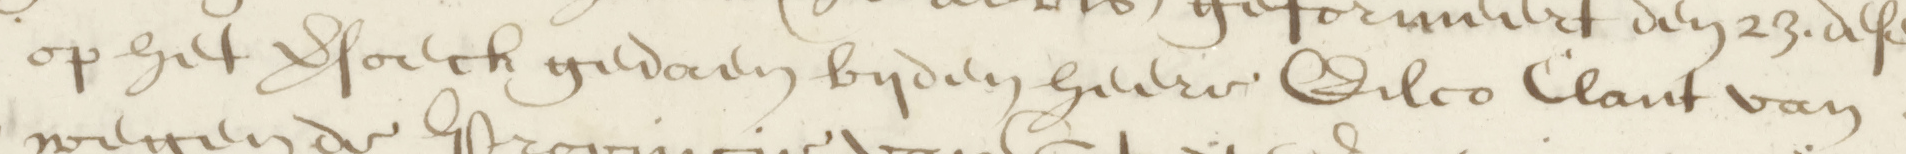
op het vsoeck gedaen byden heere Eilco Clant van
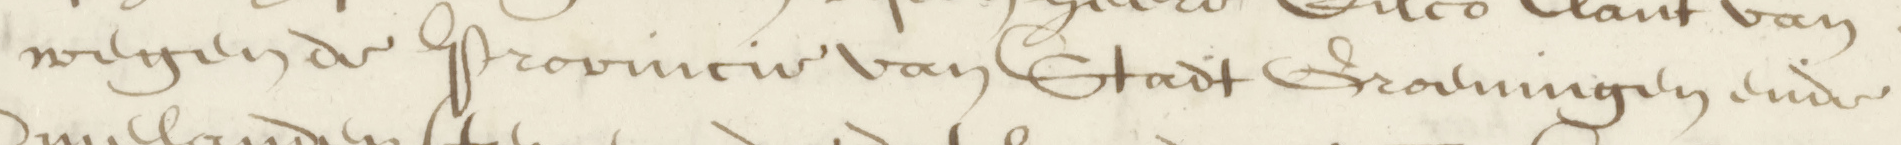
wegen de Provincie van Stadt Groeningen ende
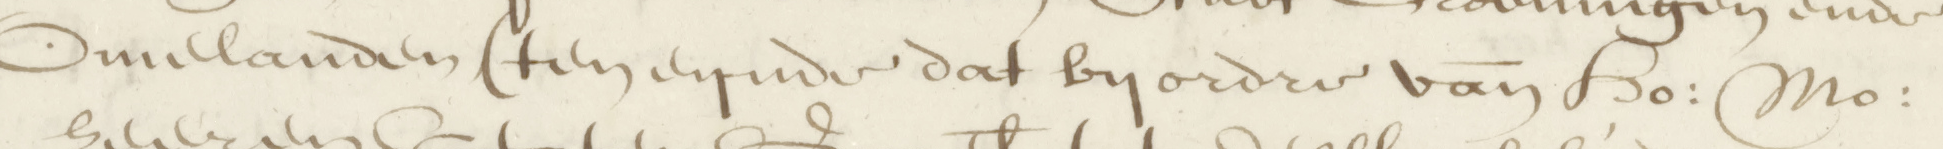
Omelanden (ten eynde dat by ordre van Ho:Mo:
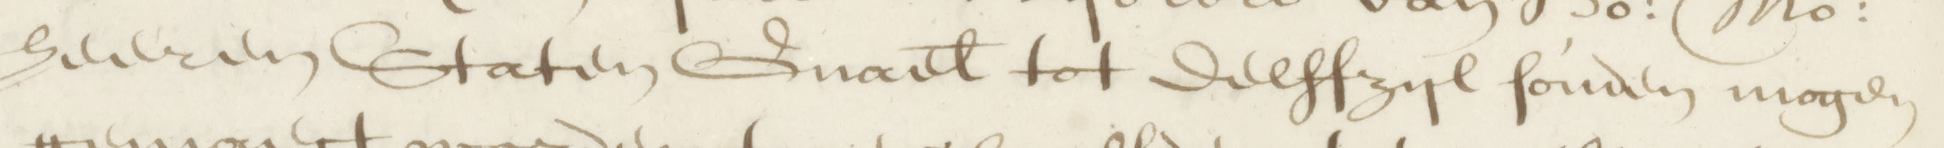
heeren Staten Gnael tot Delffzyl souden mogen
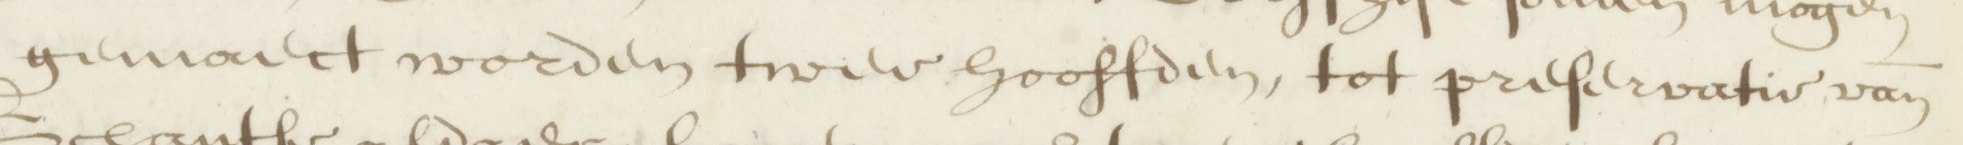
gemaect worden twee hooffden, tot preservatie van
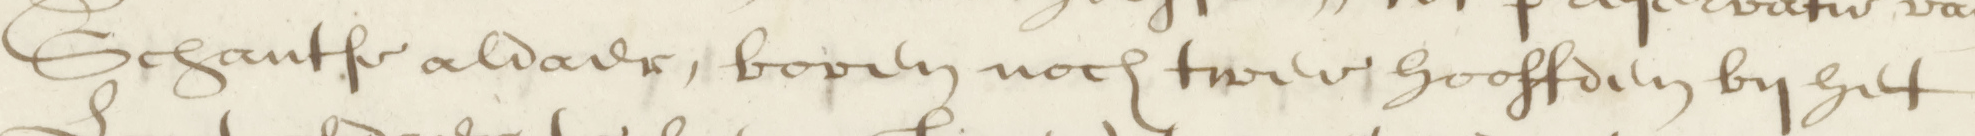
Schantse aldaer, boven noch twee hooffden by het
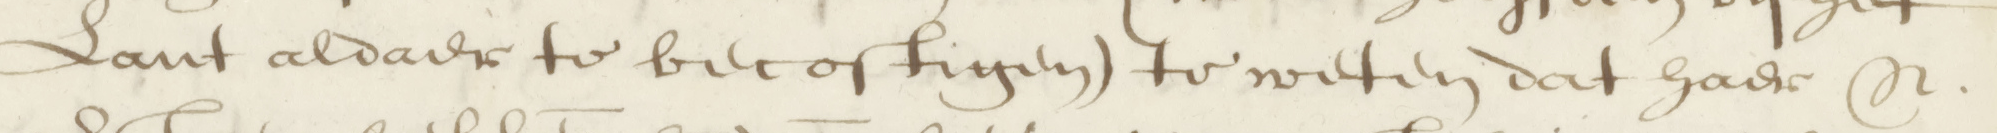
Lant aldaer te becostigen) te weten dat haer E.
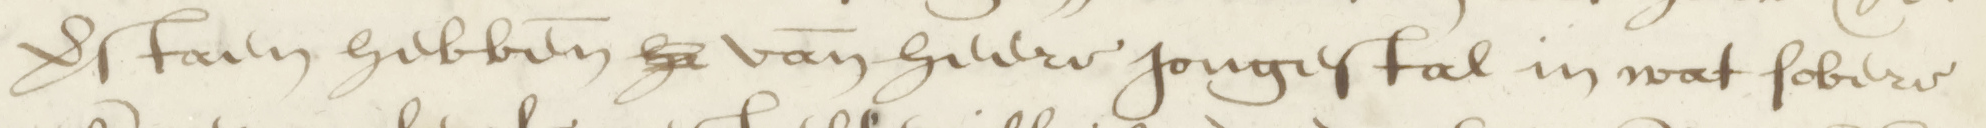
vstaen hebben he van heere Jongestal in wat sobere
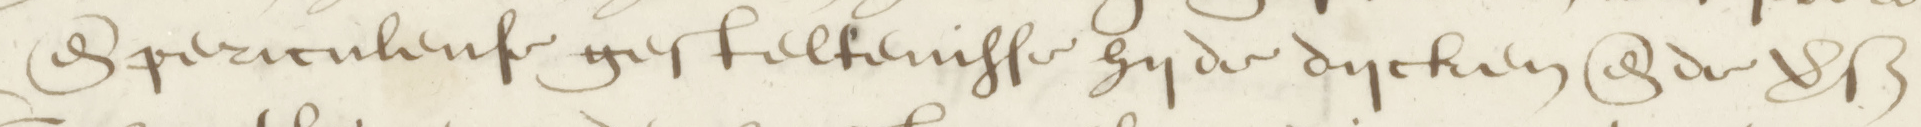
& periculeuse gesteltenisse hy de dycken & de vs
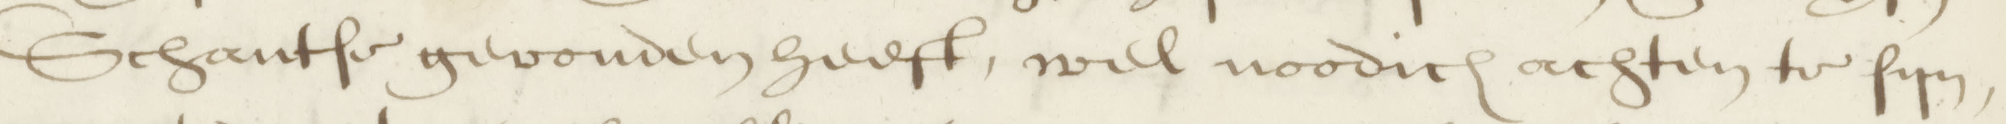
Schantse gevonden heeft, wel noodich achten te syn,
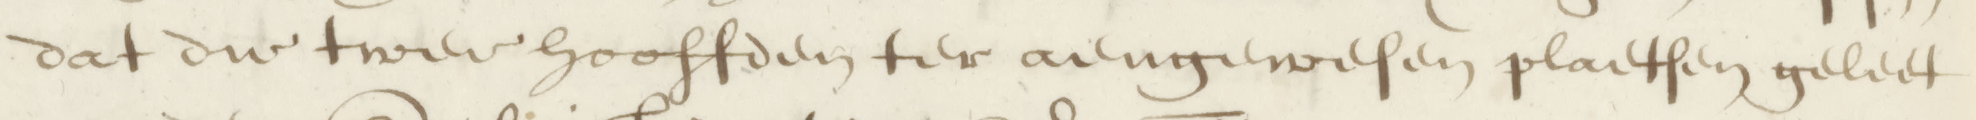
dat die twee hooffden ter aengewesen plaetsen geleet
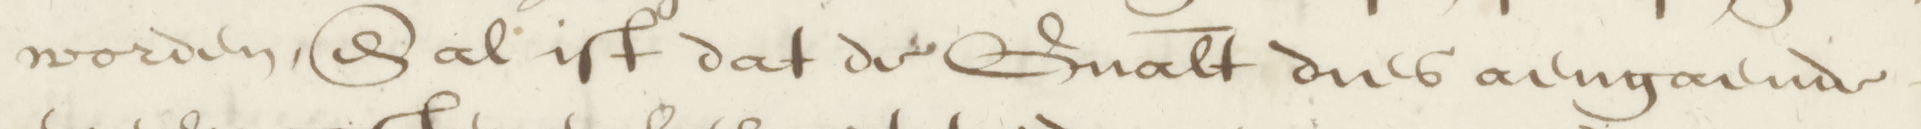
worden, & al ist dat de Gnalt dies aengaende
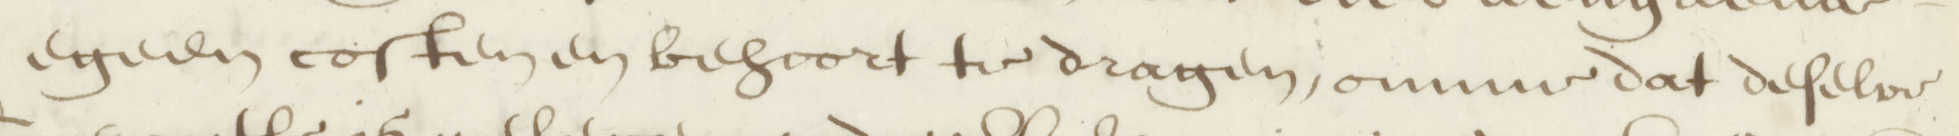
egeen costen en behoort te dragen, omme dat deselve
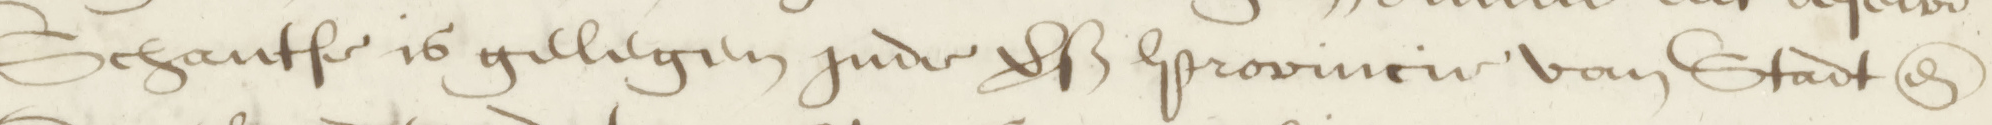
Schantse is gelegen Inde vs provincie van Stadt &
